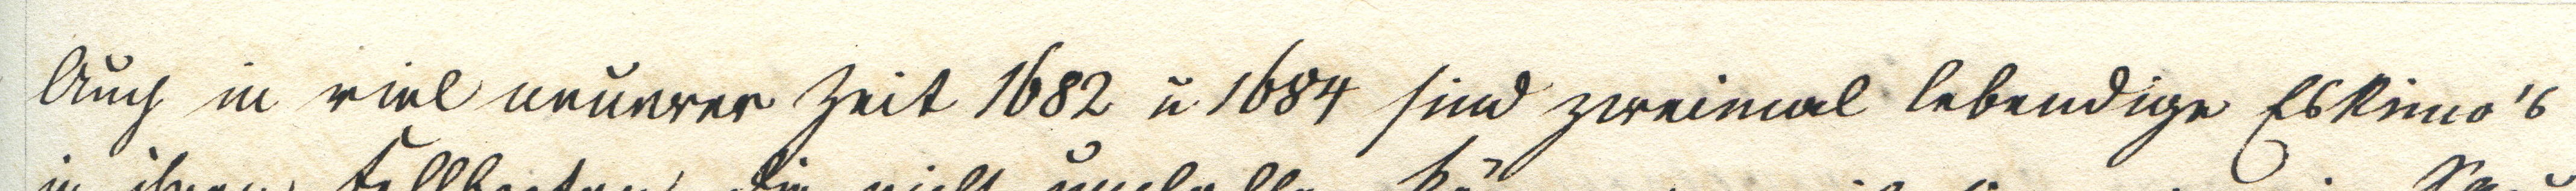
Auch in viel neuerer Zeit 1682 u 1684 sind zweimal lebendige Eskimo’s
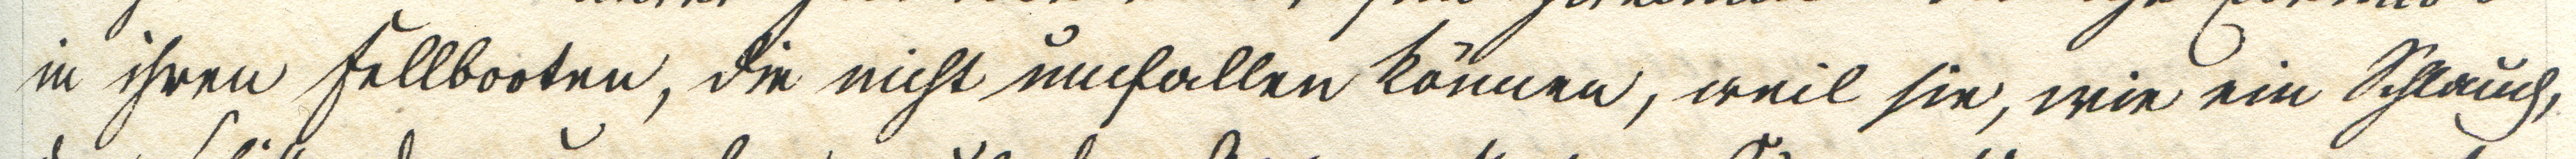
in ihren Fellbooten, die nicht umfallen können, weil sie, wie ein Schlauch,
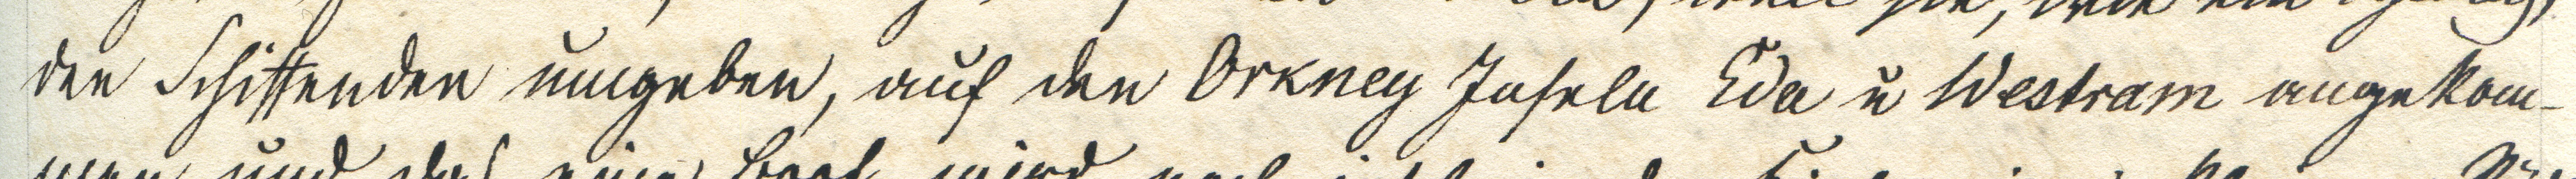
die Schiffenden umgeben, auf den Orkney Inseln Eda u Westram angekom-
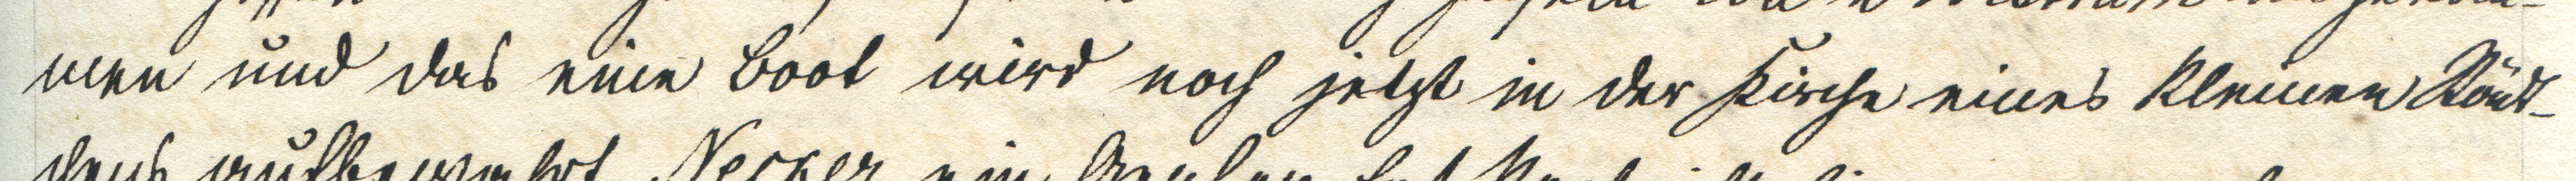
men und das eine Boot wird noch jetzt in der Kirche eines kleinen Städt-
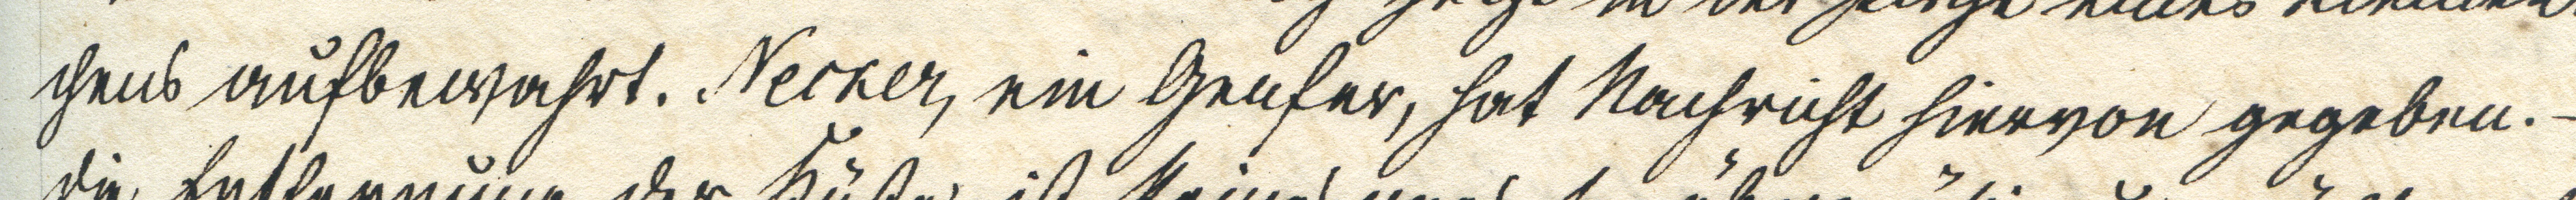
chens aufbewahrt. Necker, ein Genfer, hat Nachricht hiervon gegeben. –
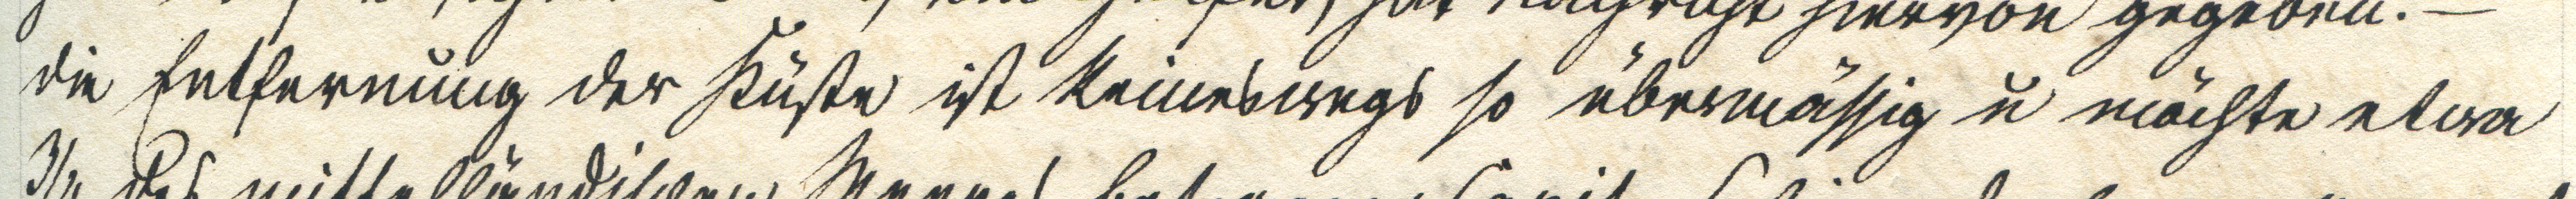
Die Entfernung der Küste ist keineswegs so übermässig u möchte etwa
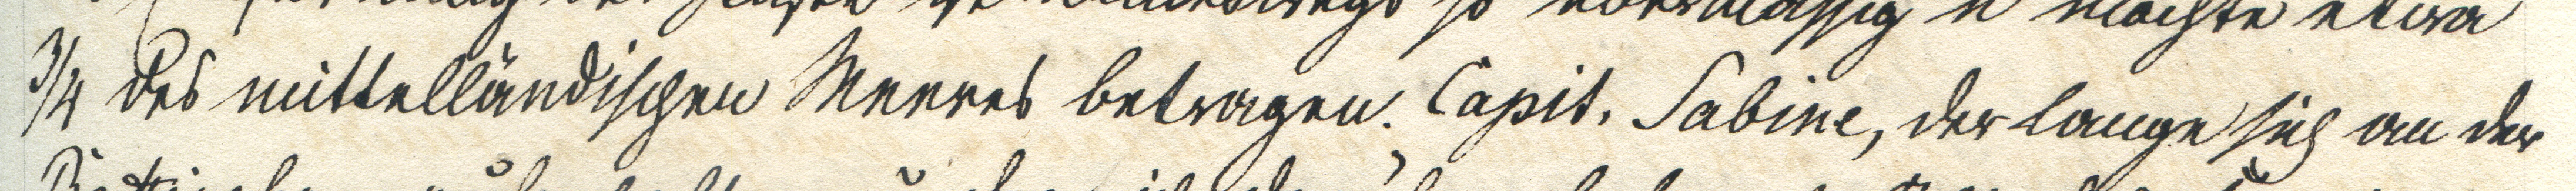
¾ des mittelländischen Meeres betragen. Capit. Sabine, der lange sich an der
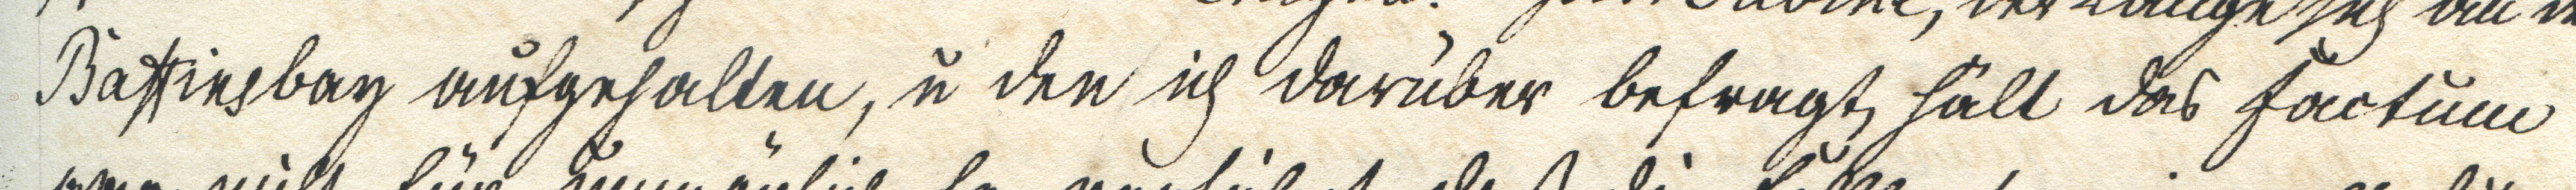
Baffinsbay aufgehalten, u den ich darüber befragte, hält das Factum
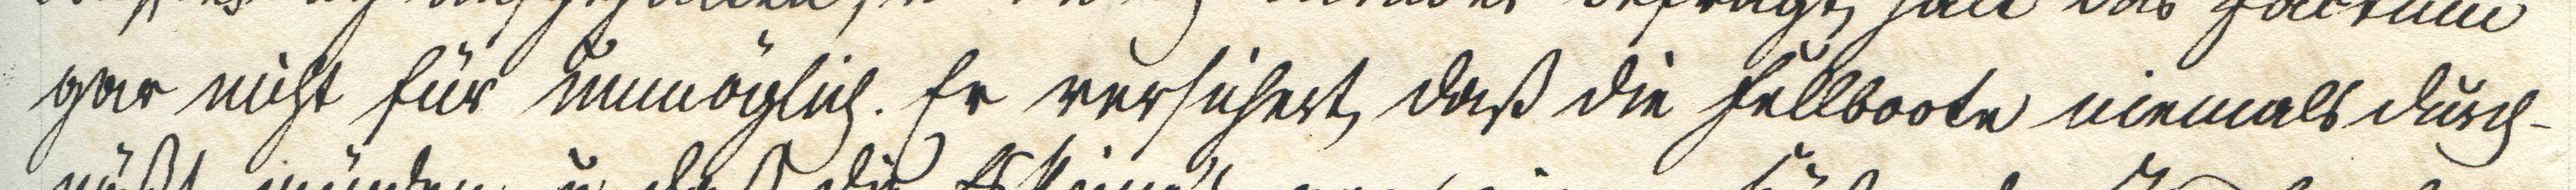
gar nicht für unmöglich. Er versichert, daß die Fellboote niemals durch-
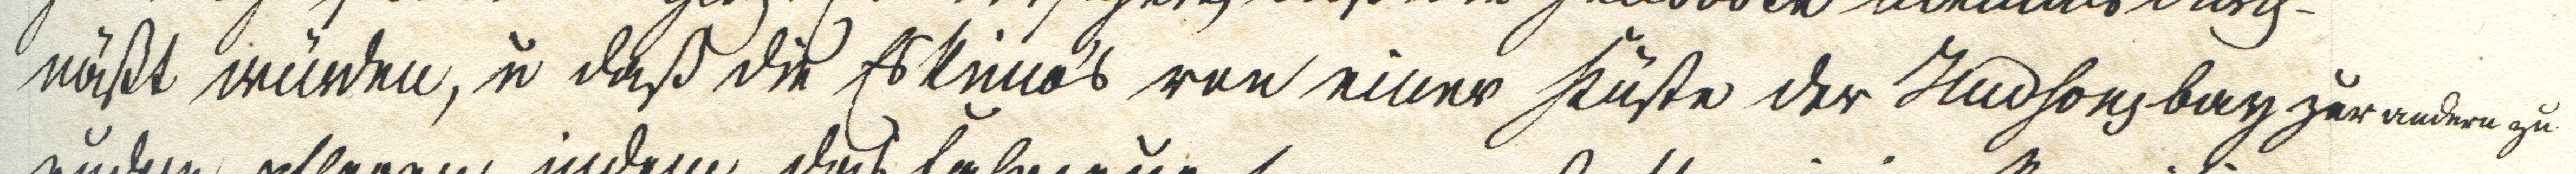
näßt würden, u daß die Eskimo’s von einer Küste der Hudsonsbay zur andern zu
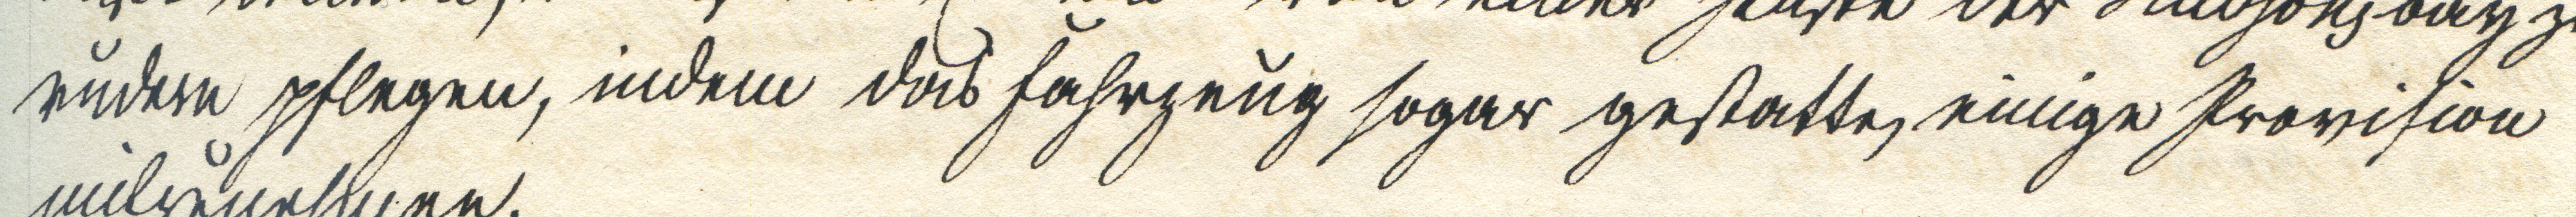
rudern pflegen, indem das Fahrzeug sogar gestatte, einige Provision
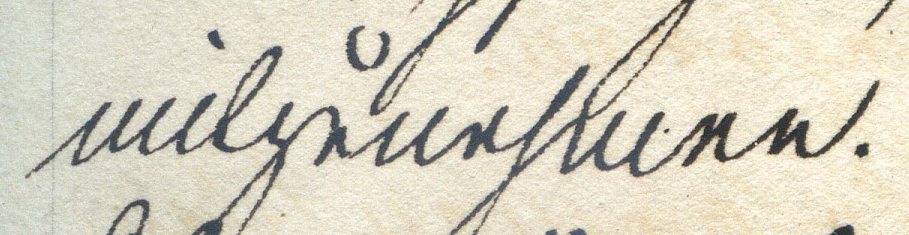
mitzuführen.
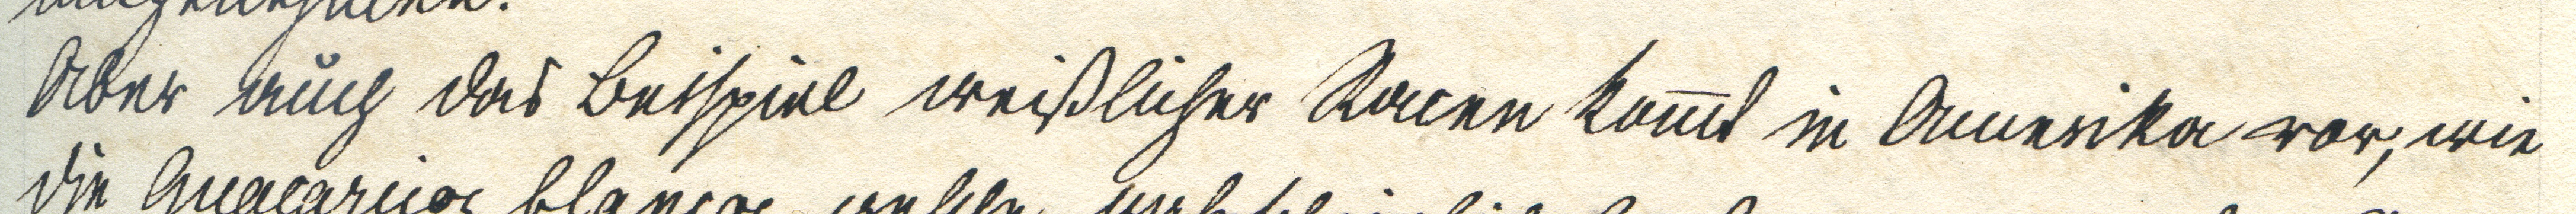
Aber auch das Beispiel weißlicher Racen kom̃t in Amerika vor, wie
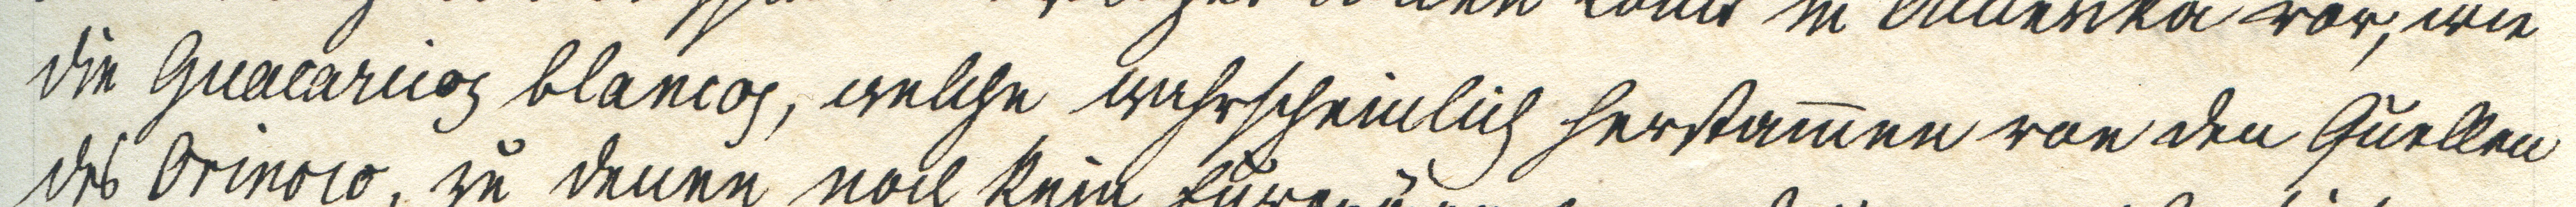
die Guacaricos blancos, welche wahrscheinlich herstam̃en von den Quellen
